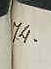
74.
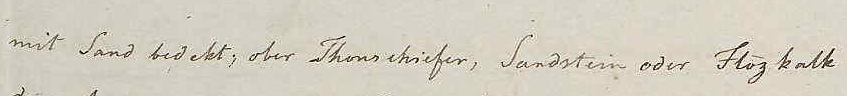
mit Sand bedekt; Thonschiefer, Sandstein oder Flözkalk
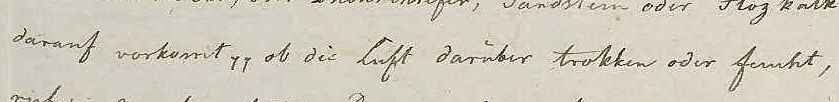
darauf vorkomt pp ob die Luft darüber trokken oder feucht,
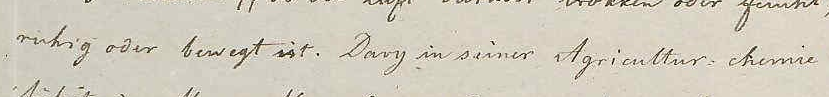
ruhig oder bewegt ist. Davy in seiner Agricultur-chemie
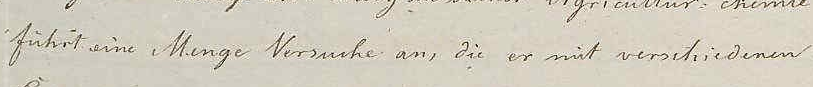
führt eine Menge Versuche an, die er mit verschiedenen
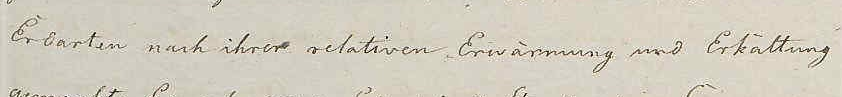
Erdarten nach ihrer relativen Erwärmung und Erkältung
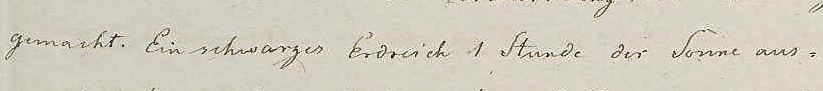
gemacht. Ein schwarzes Erdreich 1 Stunde der Sonne aus-
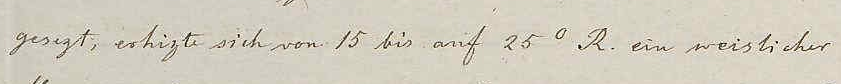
gesezt, erhizte sich von 15 bis auf 25° R. ein weislicher
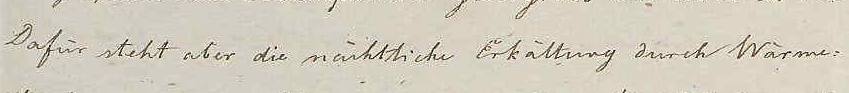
Dafür steht aber die nächtliche Erkältung durch Wärme-
